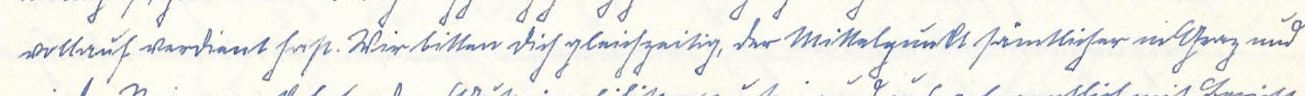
vollauf verdient hast. Wir bitten dich gleichzeitig, der Mittelpunkt sämtlicher in Graz und
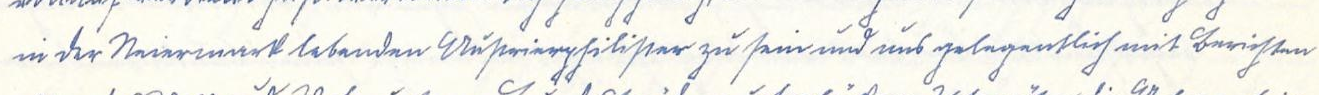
in der Steiermark lebenden Austrierphilister zu sein und uns gelegentlich mit Berichten
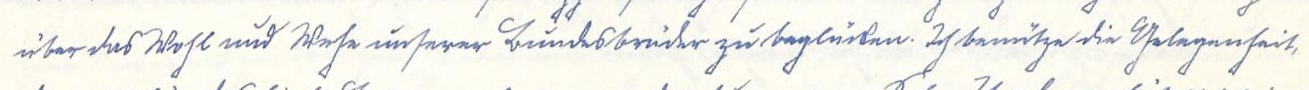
über das Wohl und Wehe unserer Bundesbrüder zu beglücken. Ich benütze die Gelegenheit,
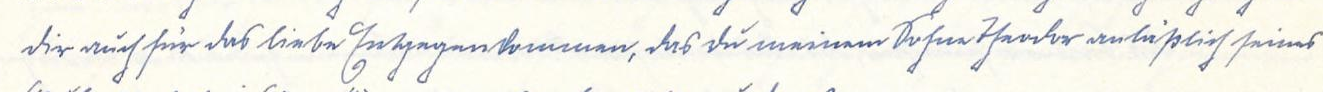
die er auch für das liebe Entgegenkommen, das du meinem Sohne Theodor anläßlich seines
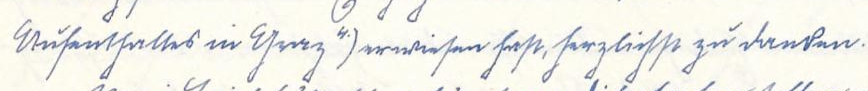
Aufenthaltes in Graz 4) erwiesen hat, herzlichst zu danken.
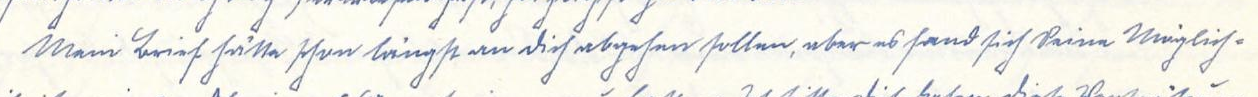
Mein Brief hätte schon längst an dich abgehen sollen, aber es fand sich keine Möglich-
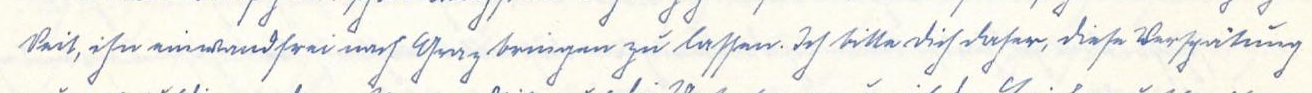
keit, ihn einwandfrei nach Graz bringen zu lassen. Ich bitte dich daher, diese Verspätung
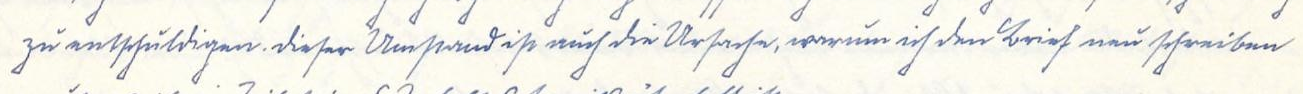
zu entschuldigen. Dieser Umstand ist auch die Ursache, warum ich den Brief nun neu schreiben
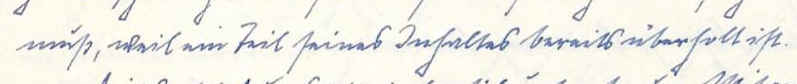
muß, weil ein Teil seines Inhaltes bereits überholt ist.
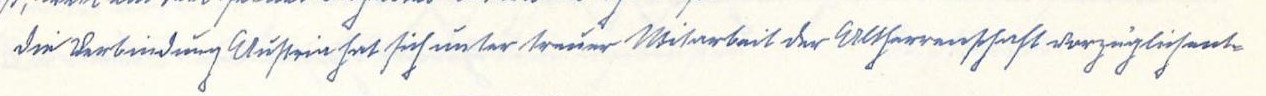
Die Verbindung Austria hat sich unter treuer Mitarbeit der Altherrenschaft vorzüglich ent
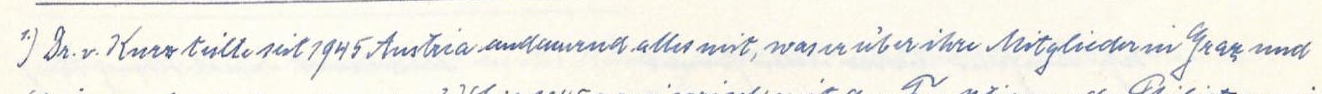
1) Dr. v. Kurz teilte seit 1945 Austria andauernd alles mit, was er über ihre Mitglieder in Graz und
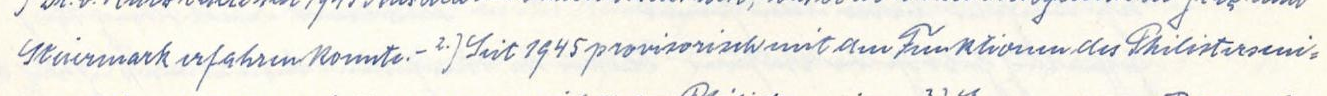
Steiermark erfahren konnte.- 2) Seit 1945 provisorisch mit den Funktionen des Philisterseni-
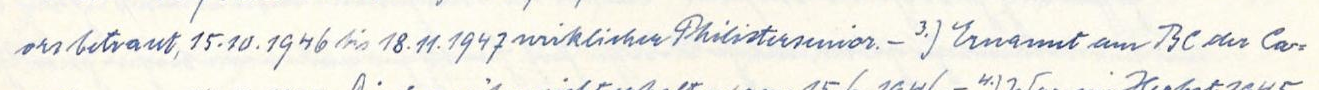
ors betraut, 15.10.1946 bis 18.11.1947 wirklicher Philistersenior..- 3) Ernannt am BC der Ca-
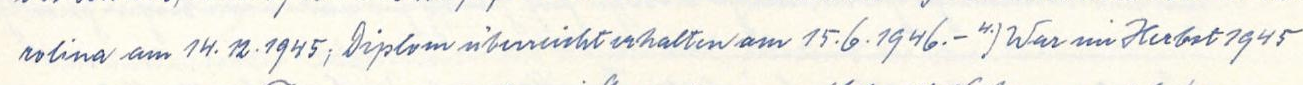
rolina am 14.12.1945, Diplom überreicht erhalten am 15.6.1946.- 4) War im Herbst 1945
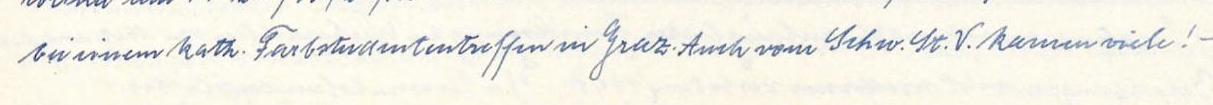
bei einem kath. Farbstudententreffen in Graz. Auch vom Schw. St. V kamen viele!
